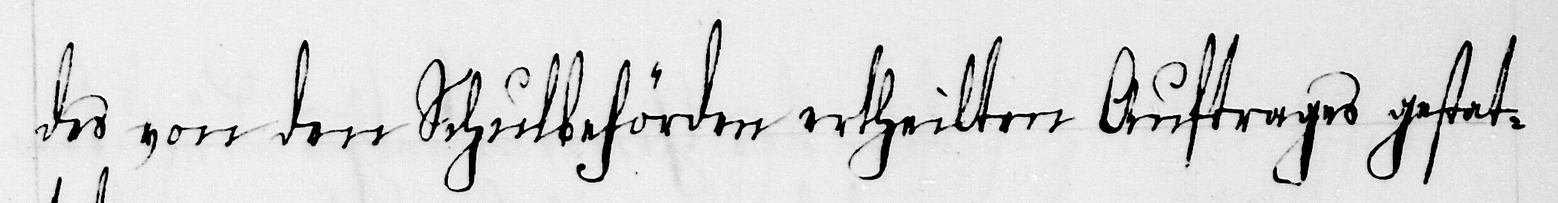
des von den Schulbehörden ertheilten Auftrages gestat¬
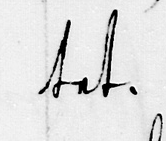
tet.
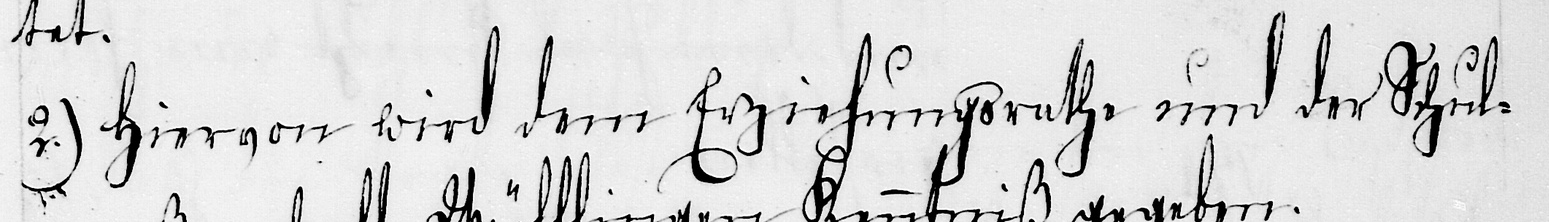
2.) Hiervon wird dem Erziehungsrathe und der Schul¬
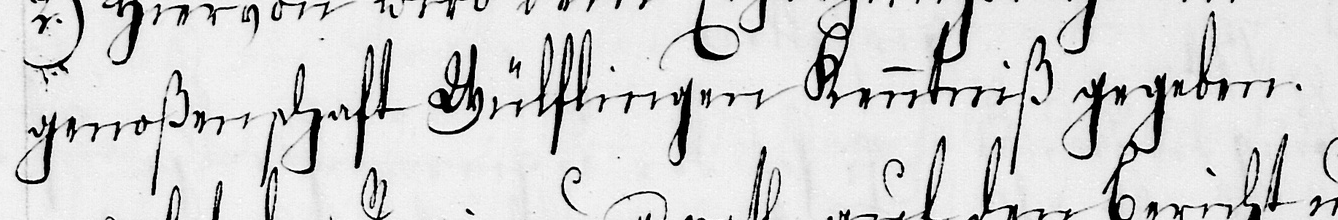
genoßenschaft Wülflingen Kenntniß gegeben.
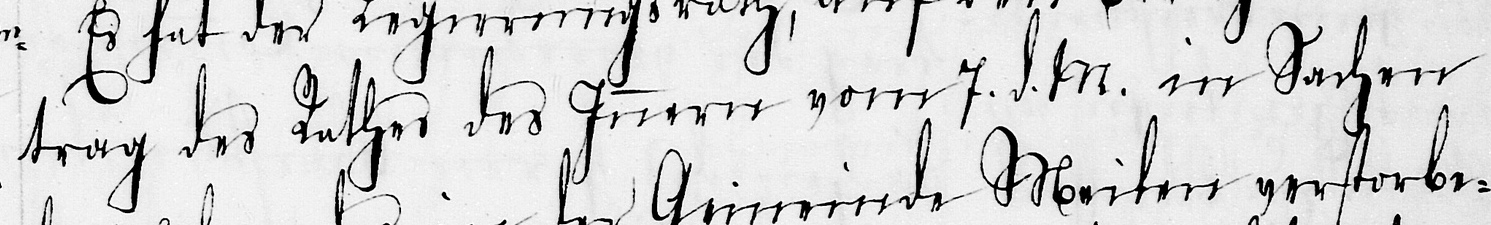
trag des Rathes des Innern vom 7. d. M. in Sachen
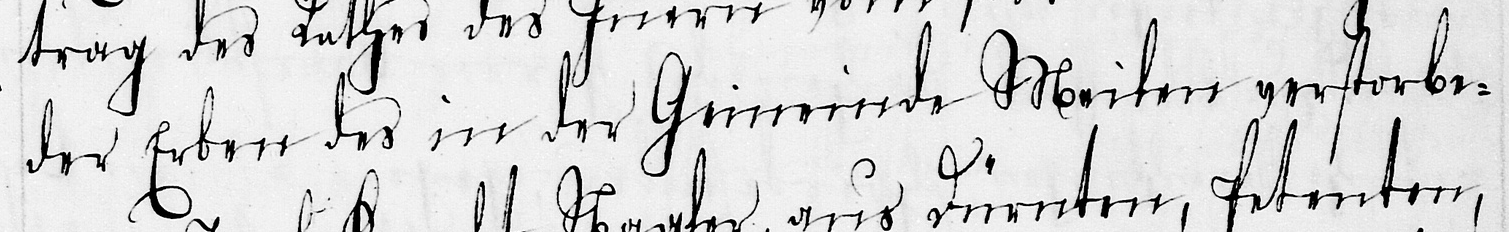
der Erben des in der Gemeinde Meilen verstorbe¬
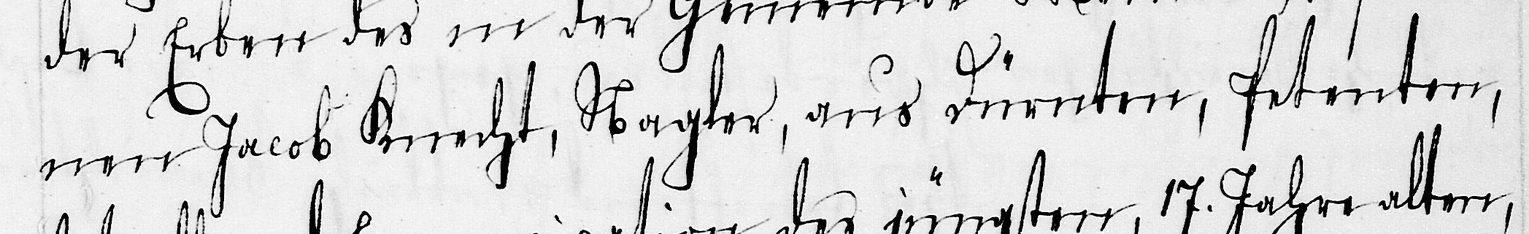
nen Jacob Knecht, Nagler, aus Dürnten, Petenten,
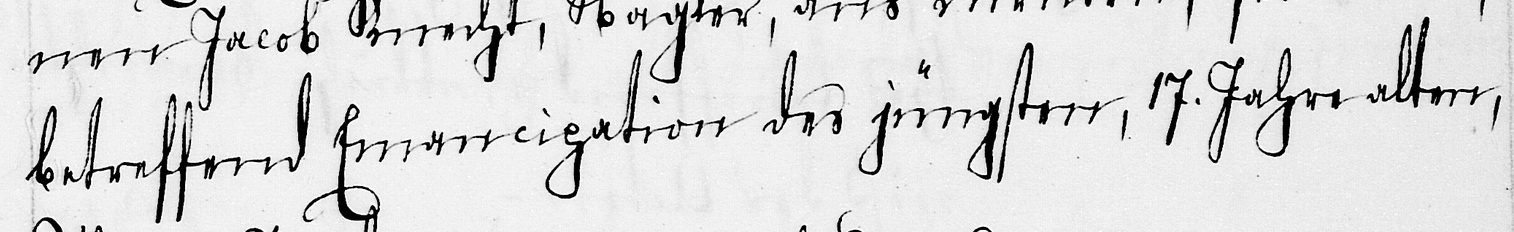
betreffend Emancipation des jüngsten, 17. Jahre alten,
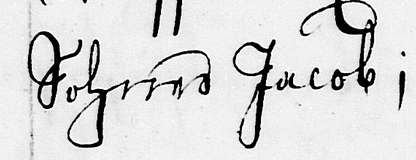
Sohnes Jacob;
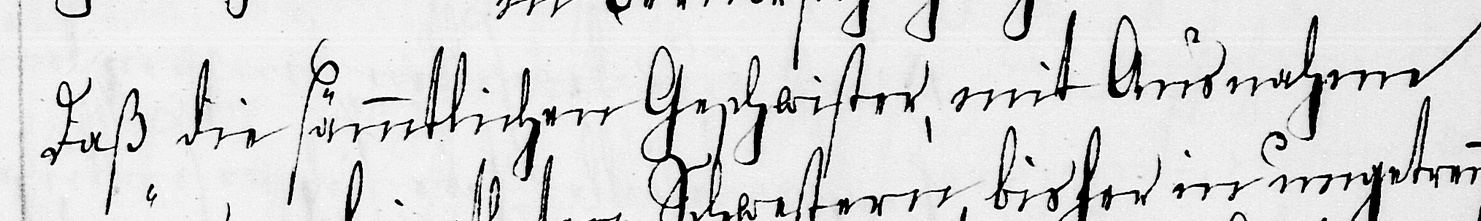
Daß die sämmtlichen Geschwister, mit Ausnahme
